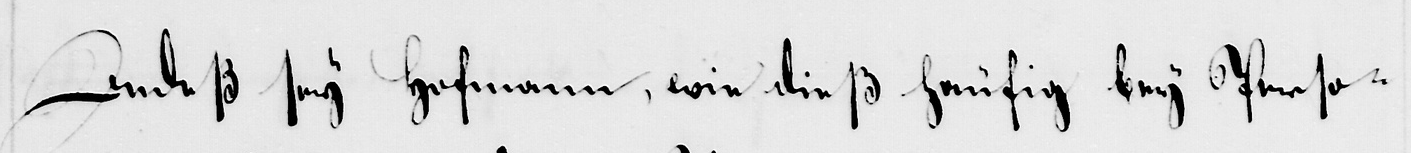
Indeß sey Hofmann, wie dieß häufig bey Perso¬
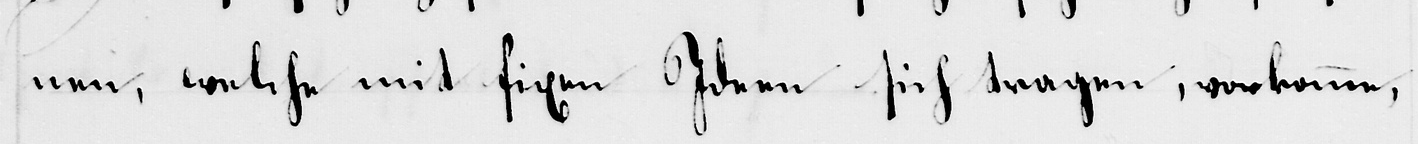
nen, welche mit fixen Ideen sich tragen, vorkomme,
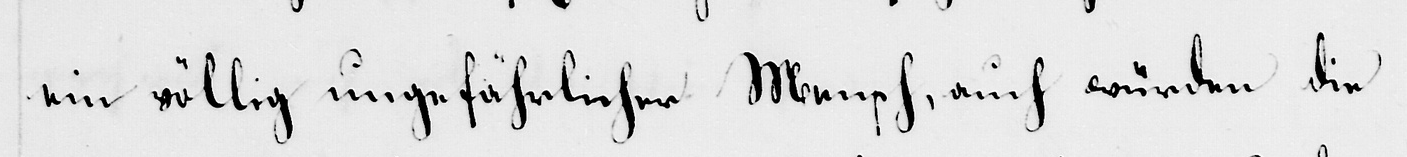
ein völlig ungefährlicher Mensch, auch würden die
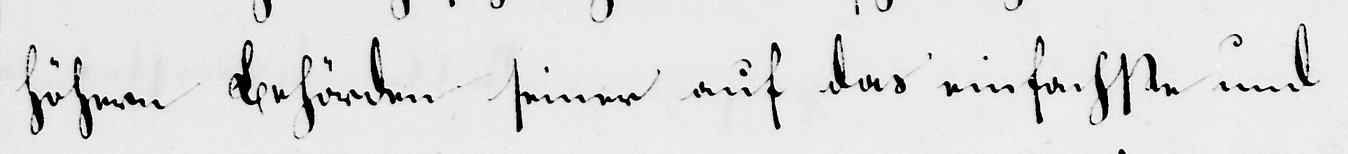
höhern Behörden seiner auf das einfachste und
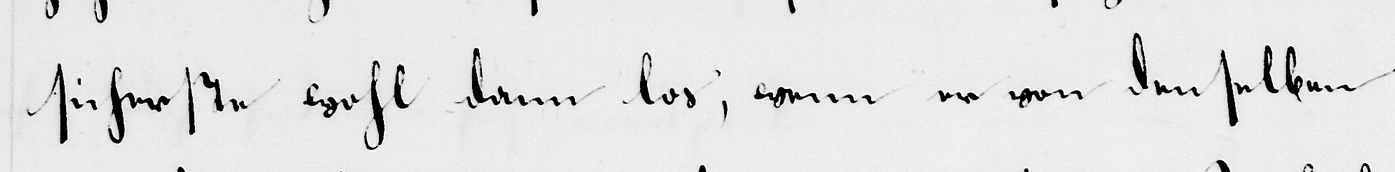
sicherste wohl dann los, wenn er von denselben
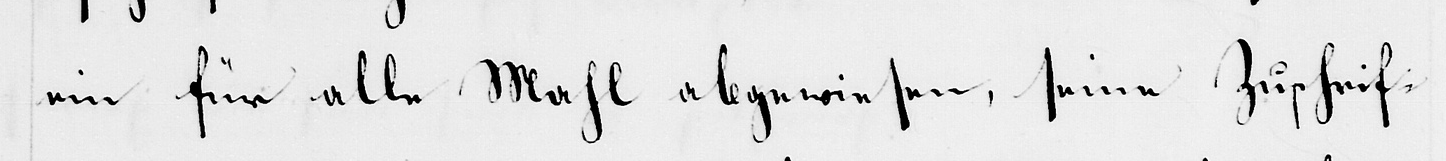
ein für alle Mahl abgewiesen, seine Zuschrif¬
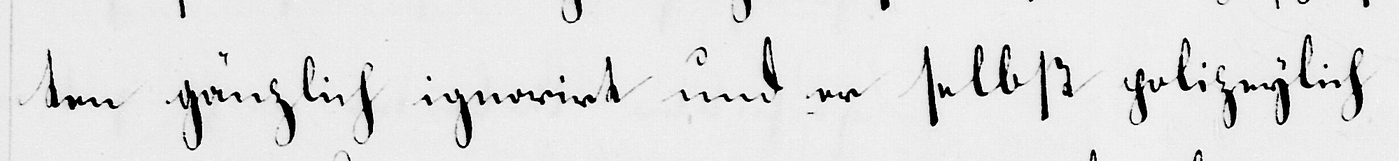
ten gänzlich ignoriert und er selbst polizeylich
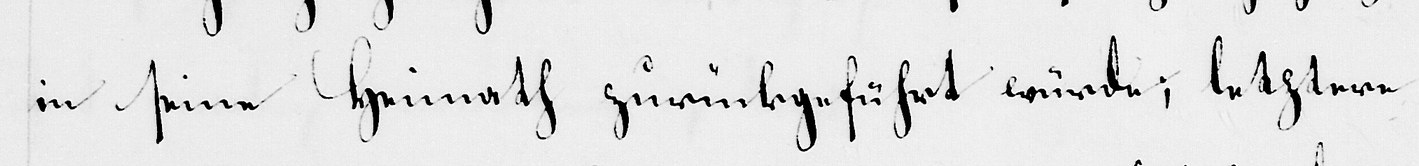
in seine Heimath zurückgeführt würde; letztere
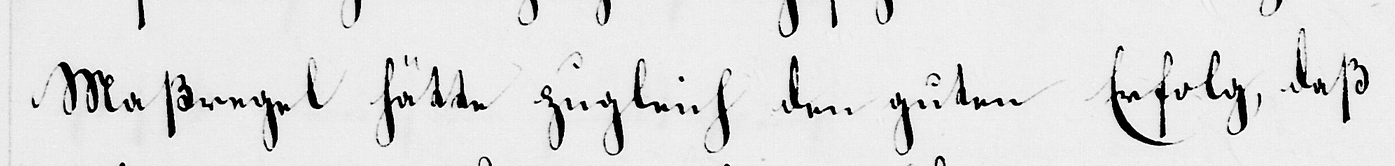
Maßregel hätte zugleich den guten Erfolg, daß
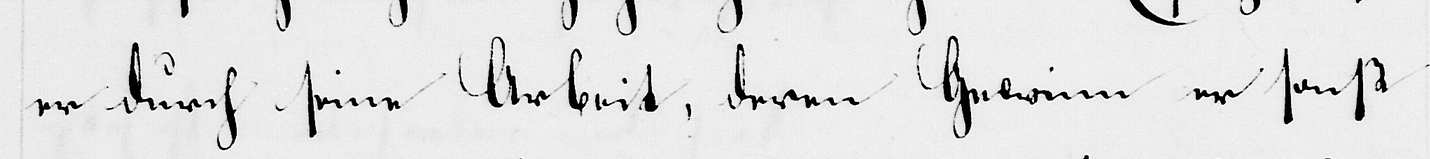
er durch seine Arbeit, deren Gewinn er sonst
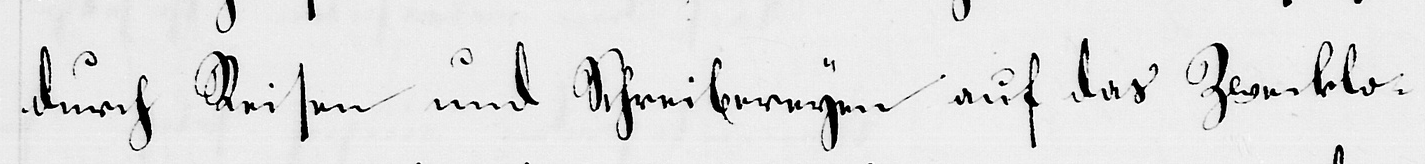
durch Reisen und Schreibereyen auf das Zwecklo¬
